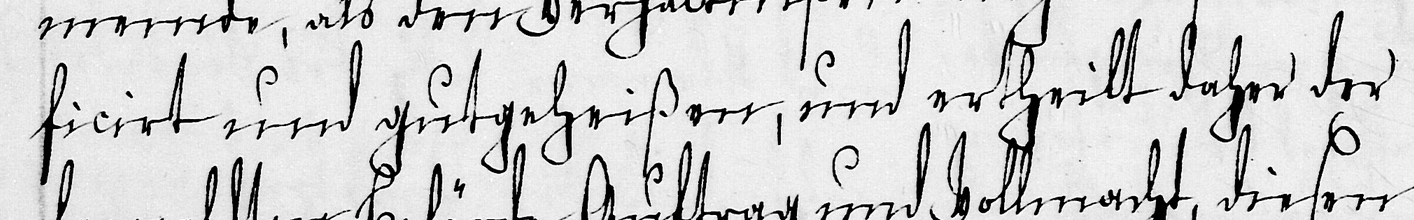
ficirt und gutgeheißen, und ertheilt daher der
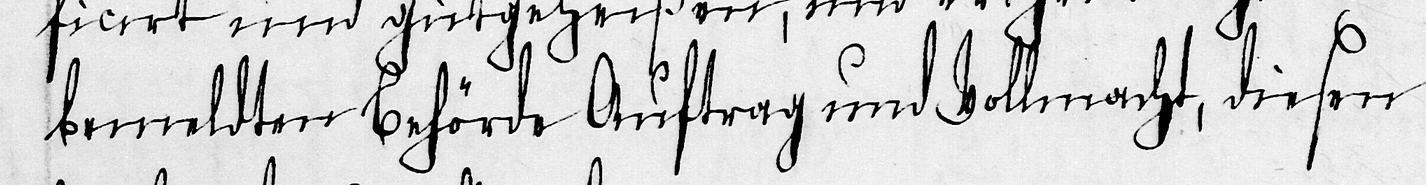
bemeldten Behörde Auftrag und Vollmacht, diesen
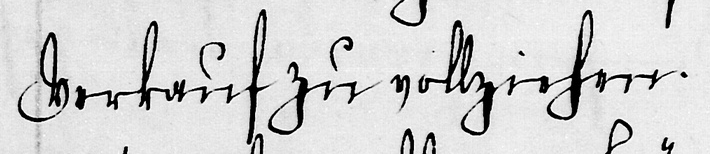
Verkauf zu vollziehen.
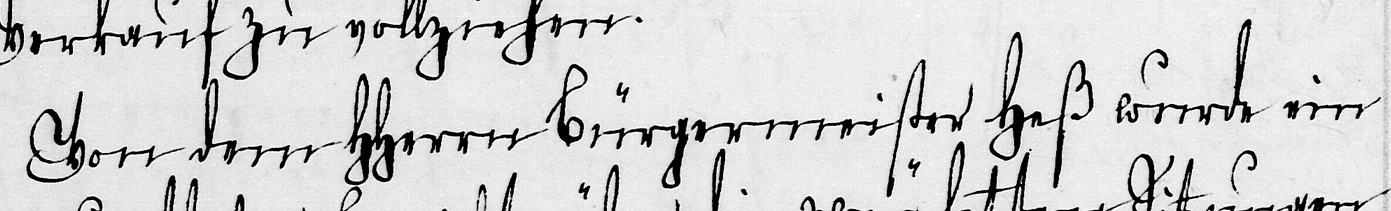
Von dem HHerrn Bürgermeister Heß wurde ein
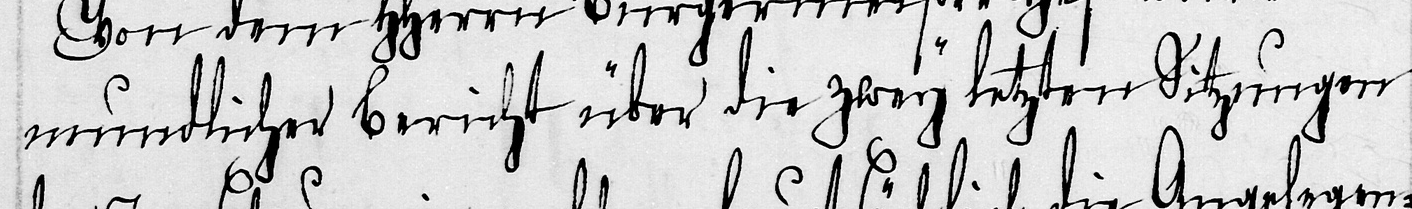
mundlicher Bericht über die zwey letzten Sitzungen
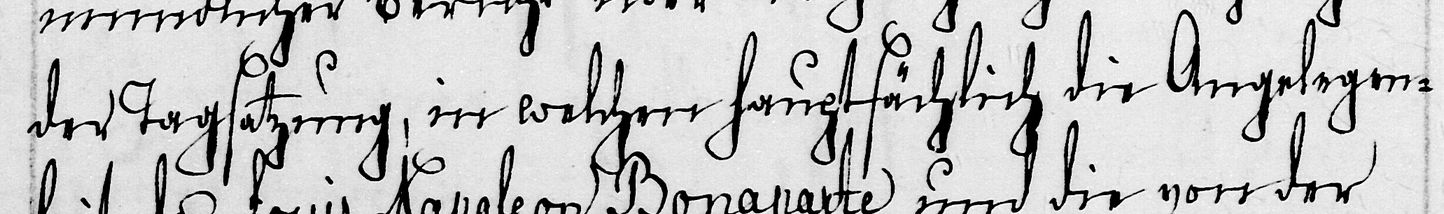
der Tagsatzung, in welchen hauptsächlich die Angelegen¬
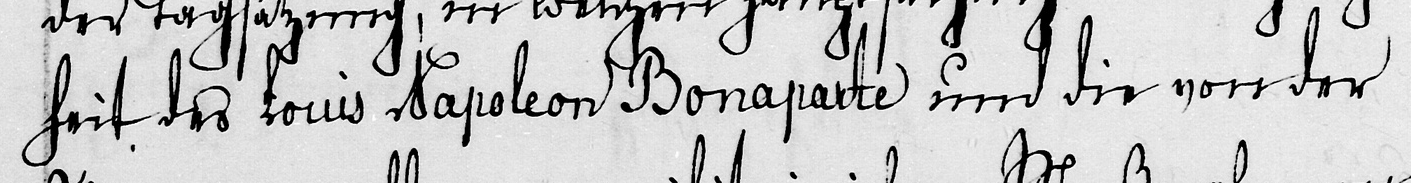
heit des Louis Napoleon Bonaparte und die von der
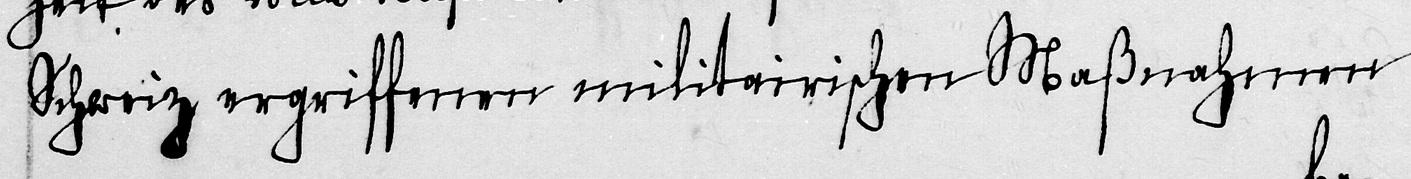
Schweiz ergriffenen militairischen Maßnahmen
